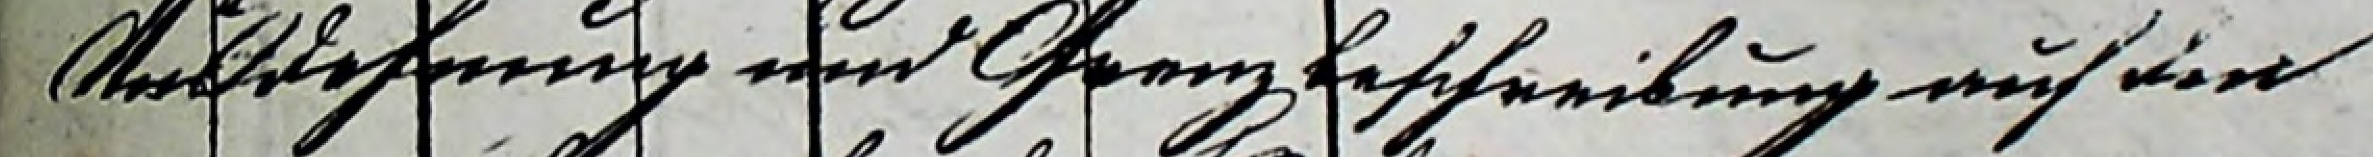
Ausdehnung und Grenzbeschreibung auf den
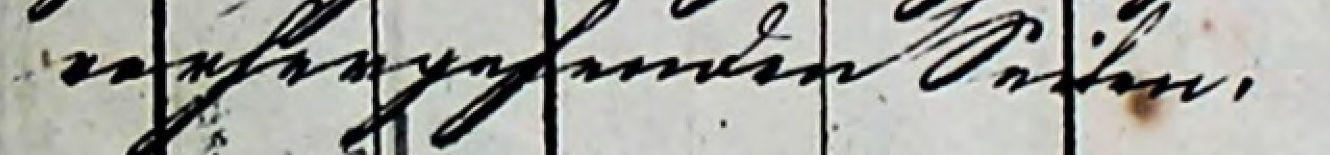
vorhergehenden Seiten,
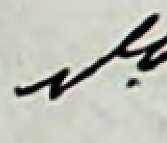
do
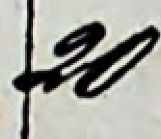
20
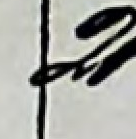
21
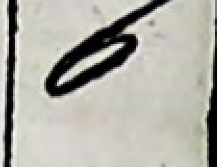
6
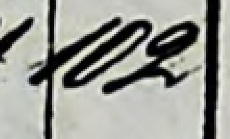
102
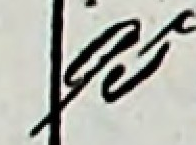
95
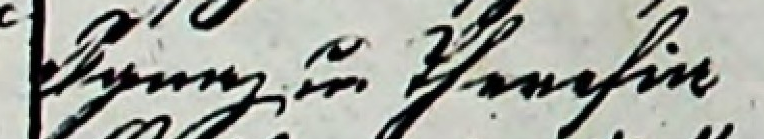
Franz u. Theresia
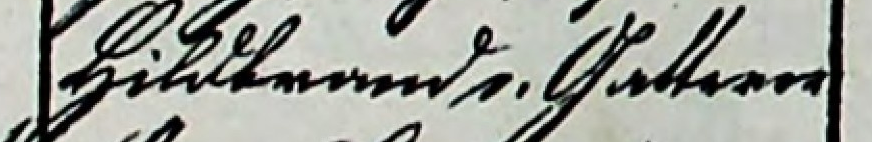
Hildbrand v. Gatterer
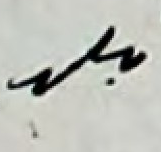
do
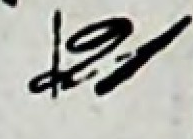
21
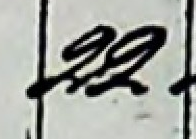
22
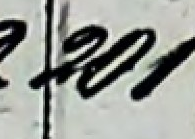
201
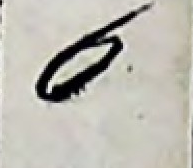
6
